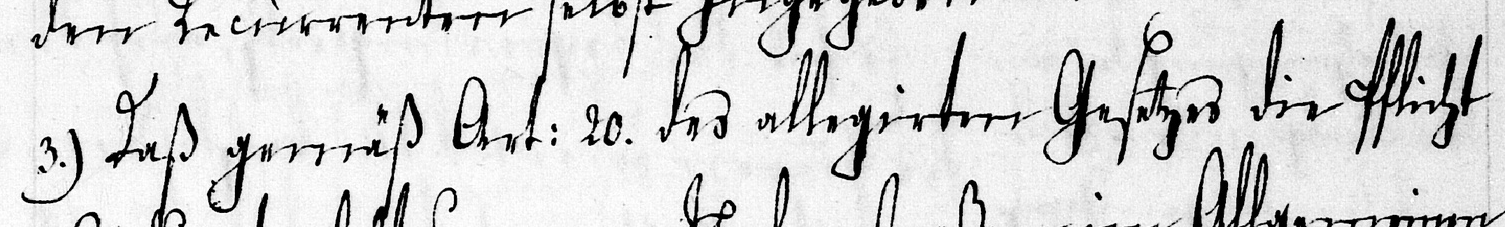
3.) Daß gemäß Art: 20. des allegirten Gesetzes die Pflicht
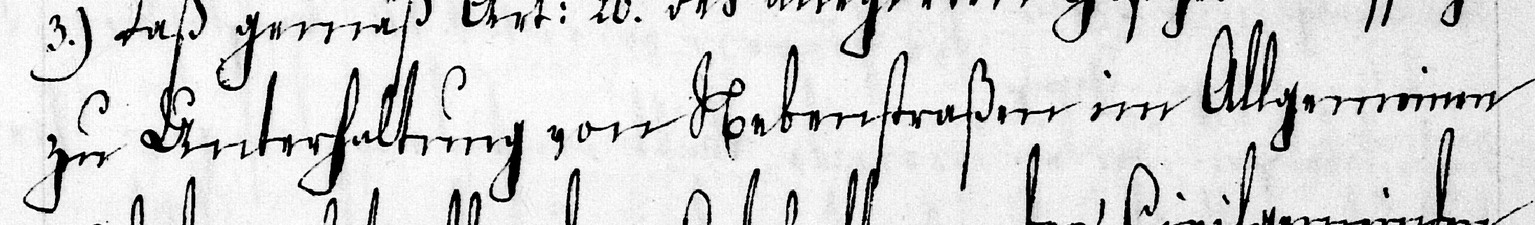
zu Unterhaltung von Nebenstraßen im Allgemeinen
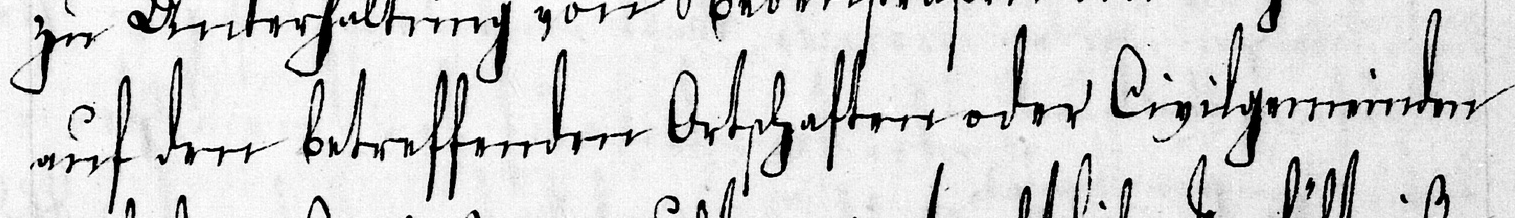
auf den betreffenden Ortschaften oder Civilgemeinden
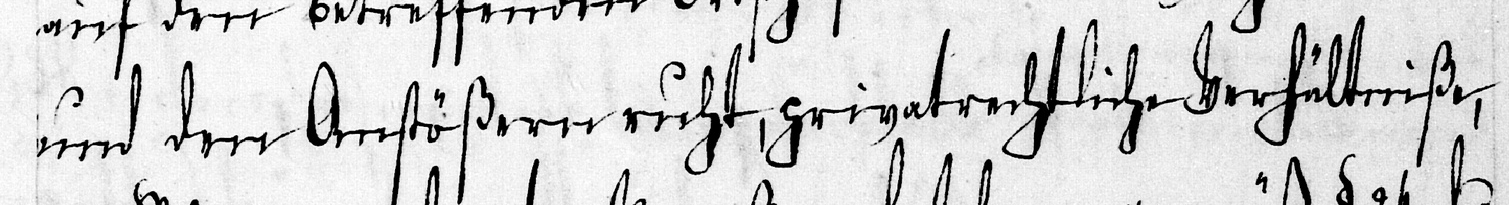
und den Anstößern ruht, privatrechtliche Verhältniße,
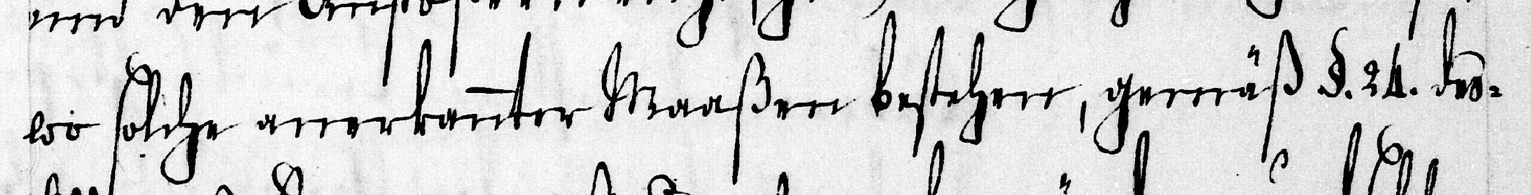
wo solche anerkannter Maaßen bestehen, gemäß §. 24. des¬
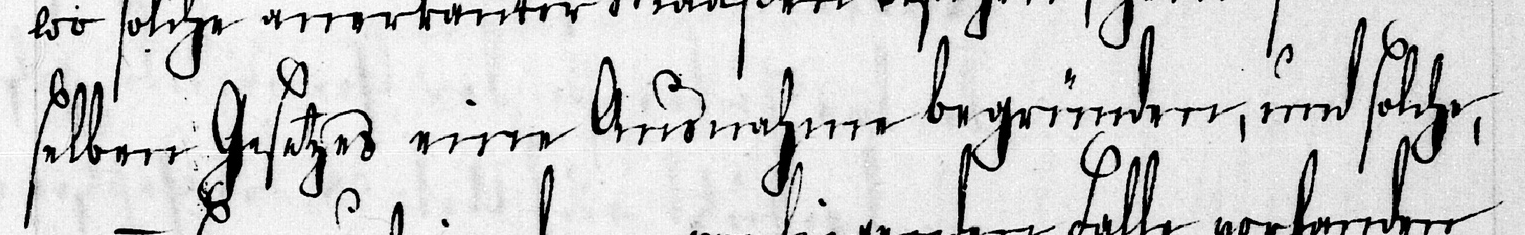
selben Gesetzes eine Ausnahme begründen, und solche,
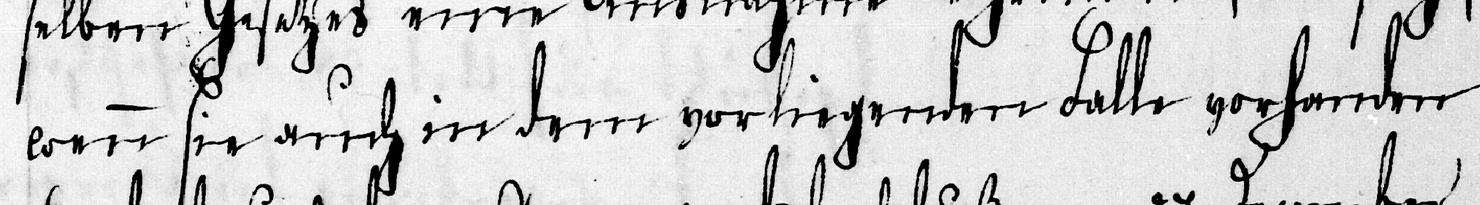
wenn sie auch in dem vorliegenden Falle vorhanden
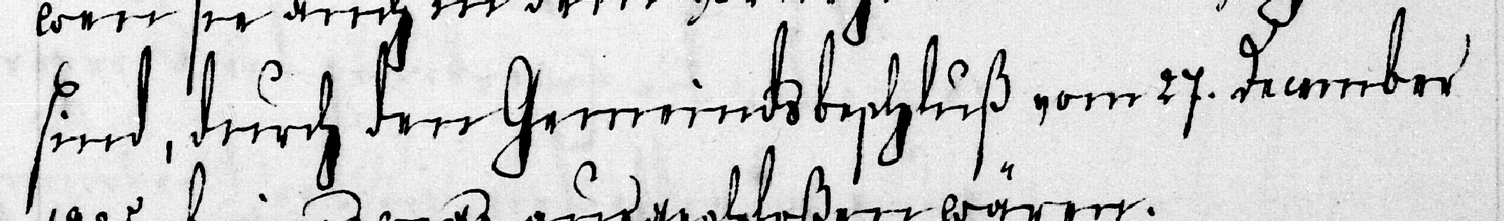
sind, durch den Gemeindsbeschluß vom 17. December
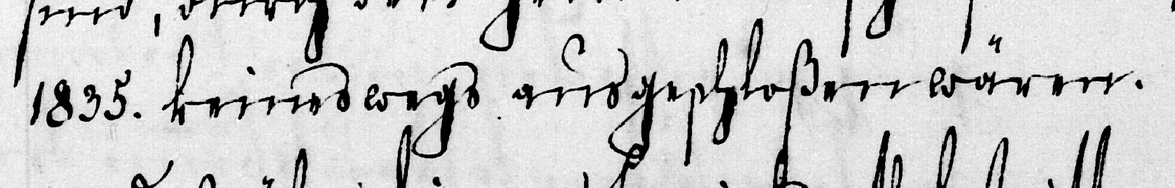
1835. keineswegs ausgeschloßen wären.
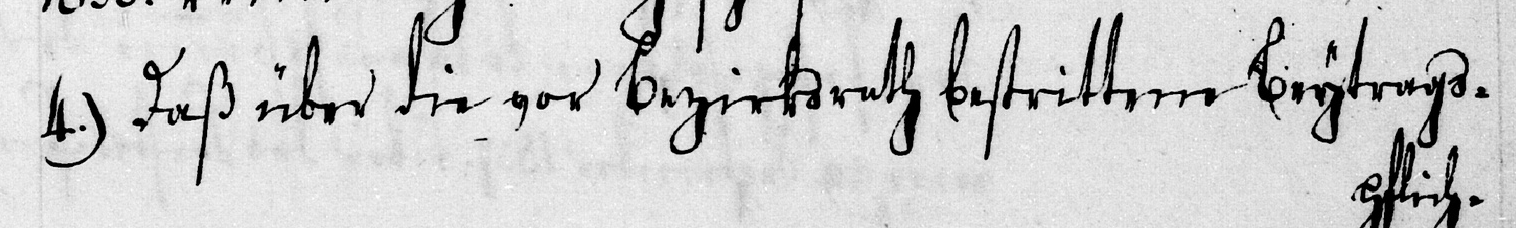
4.) Daß über die vor Bezirksrath bestrittene Beytrags-
